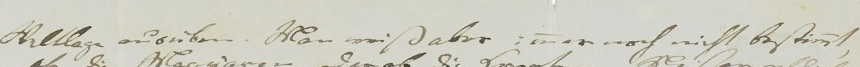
Weltlage ausüben. Man weiß aber immer noch nicht bestimmt,
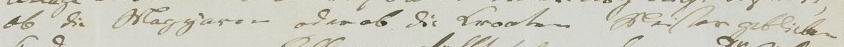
ob die Magyaren oder ob die Croaten Meister geblieben
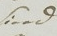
sind. –
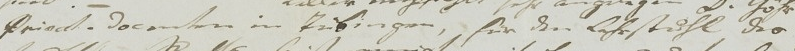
Privat-Docenten in Tübingen, für den Lehrstuhl des
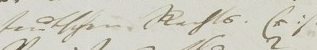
teutschen Rechts. Er ist
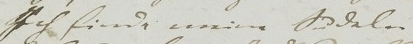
Ich finde meine Sudelei
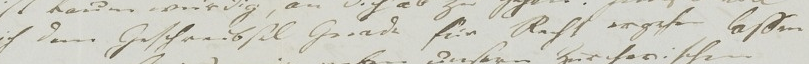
ich dem Geschreibsel Gnade für Recht ergehen lassen.
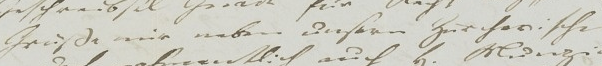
Grüße mir neben unsern Zürcherischen
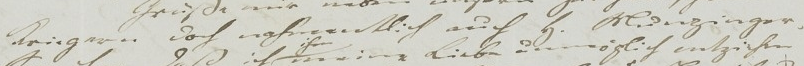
Kriegern doch nahmentlich auch H. Munzinger.
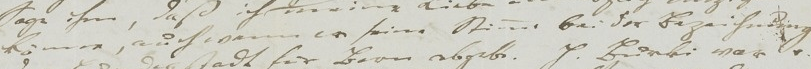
könne, auch wenn er seine Stimme bei der Bezeichnung
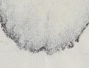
Dein
